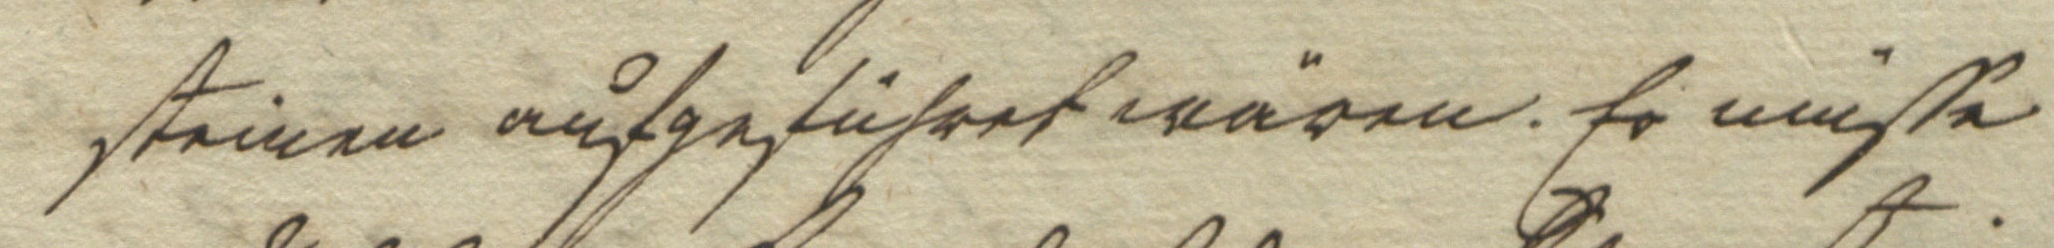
steinen aufgeführet wären. Er müsse
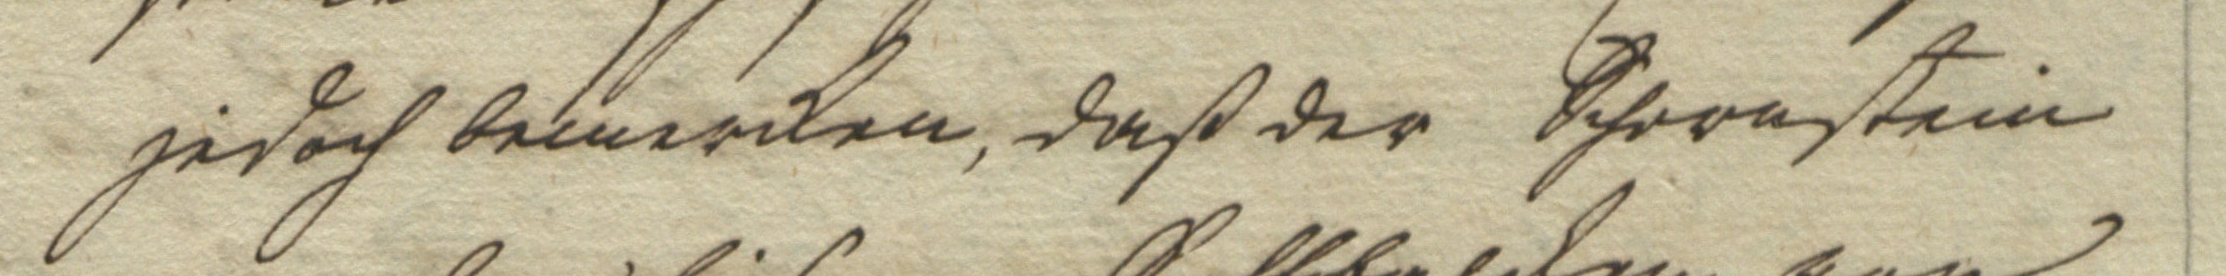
jedoch bemercken, daß der Schornstein
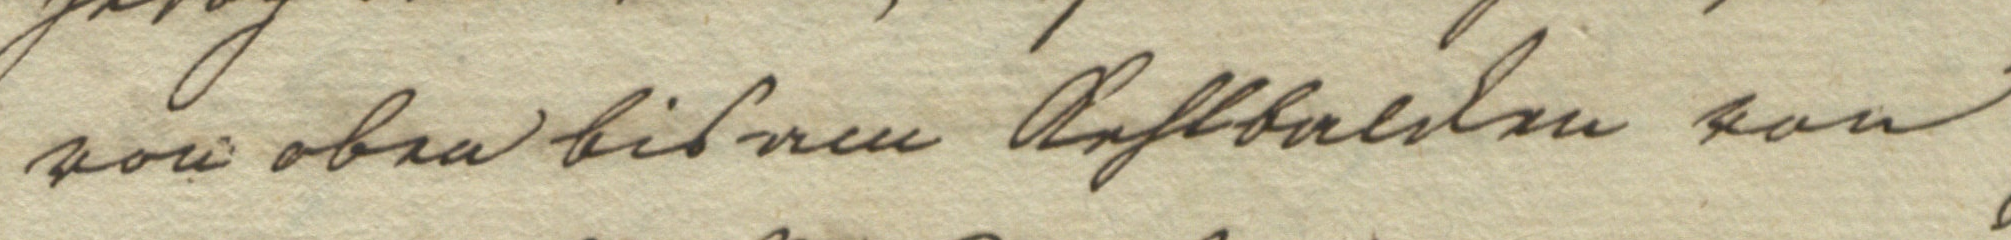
von oben bis am Kehlbalcken von
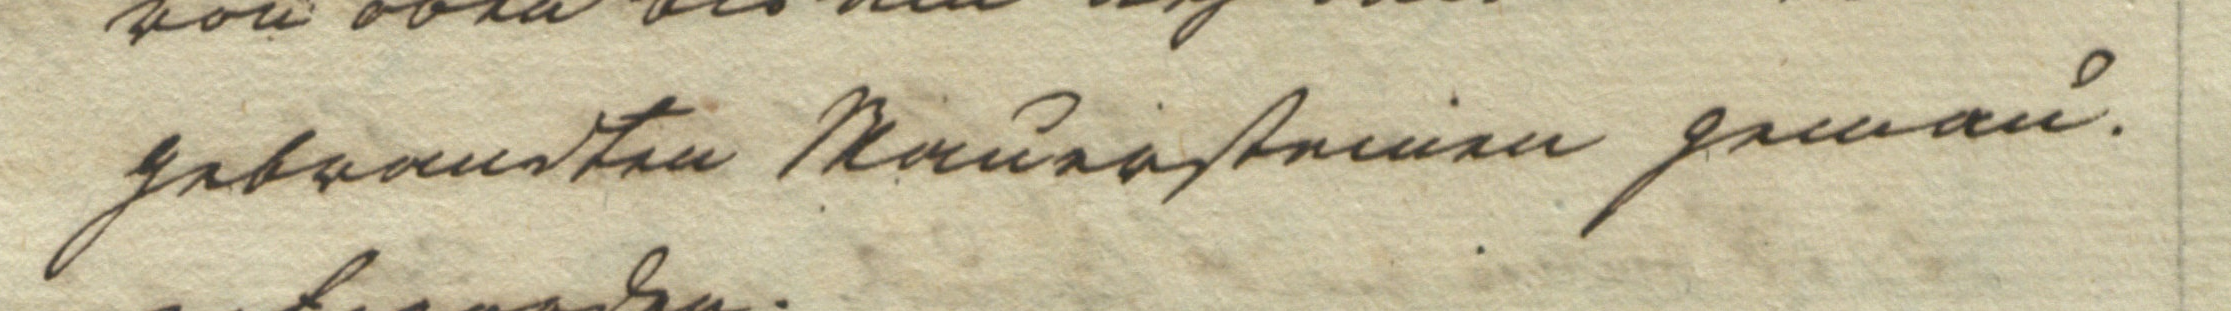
gebrandten Mauersteinen gemau¬
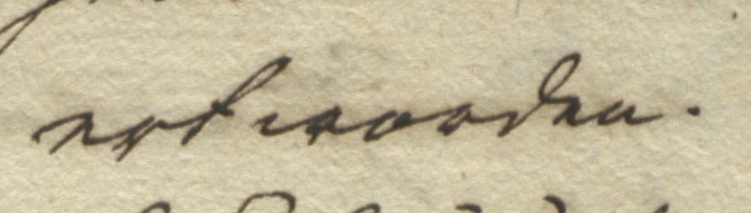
ert worden.
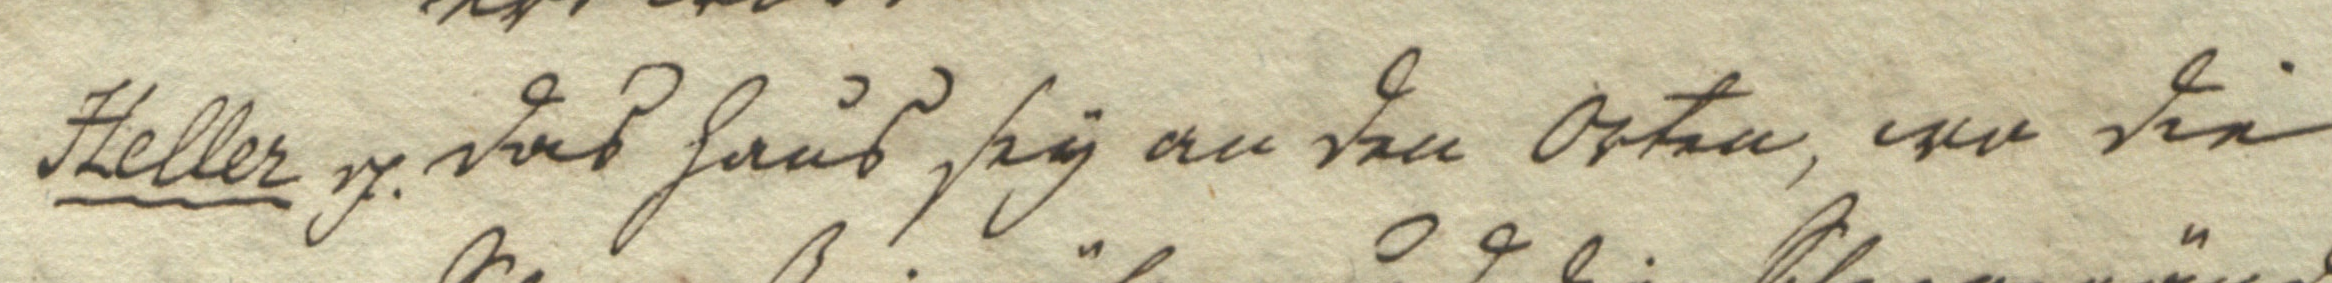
Heller rf. Das Haus seÿ an den Orten, wo die
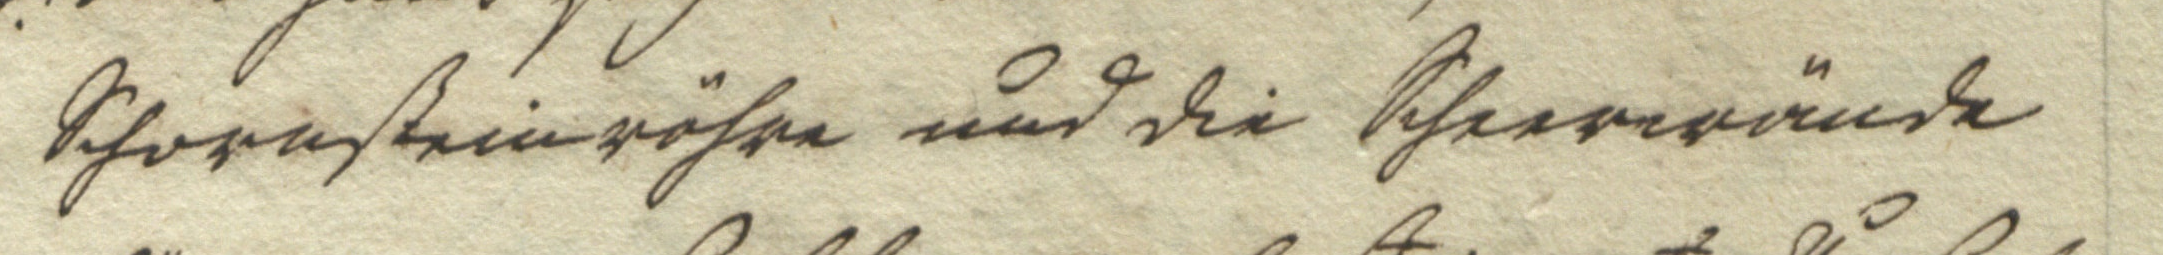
Schornsteinröhre und die Scheerwände
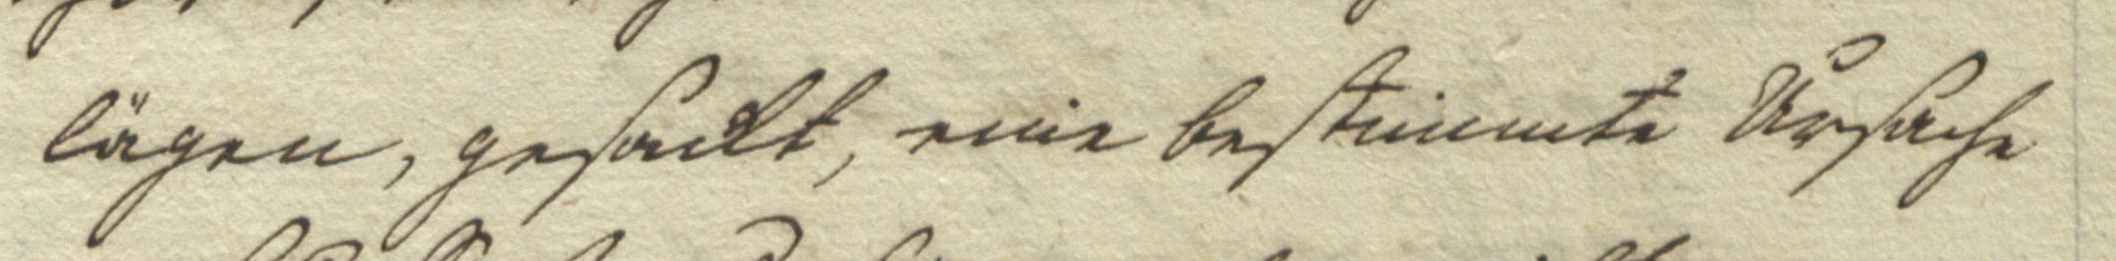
lägen, gesackt, eine bestimmte Ursache
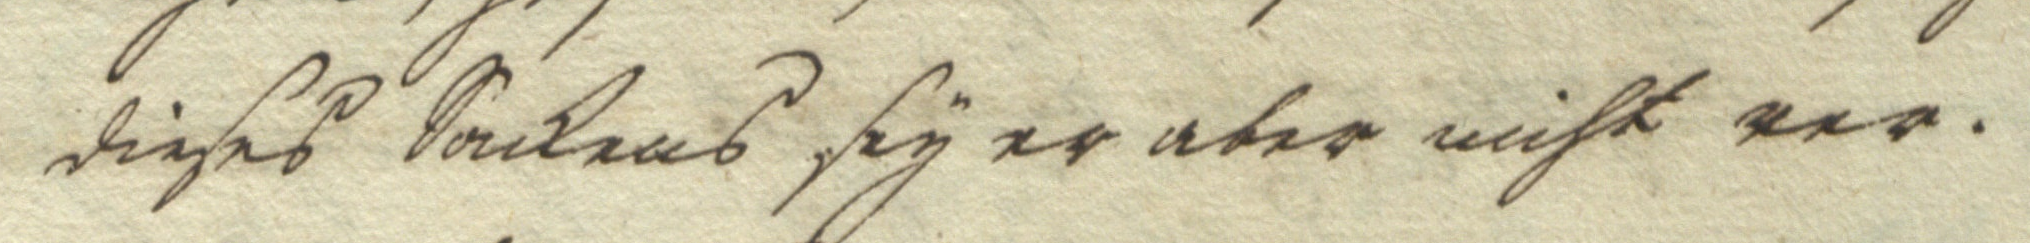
dieses Sackens seÿ er aber nicht ver¬
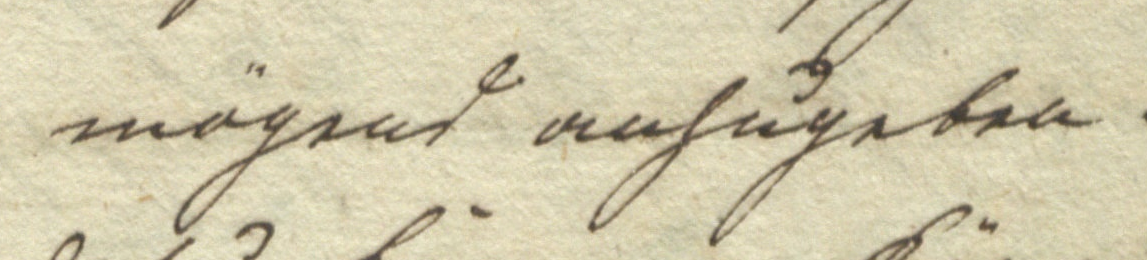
mögend anzugeben.
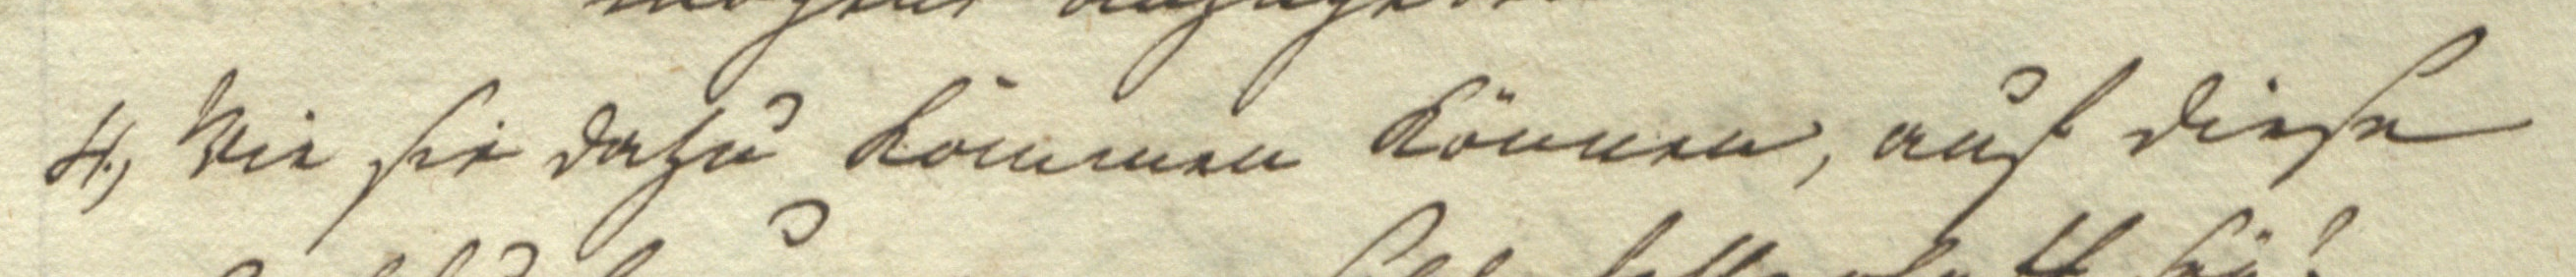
4., Wie sie dazu kommen können, auf diese
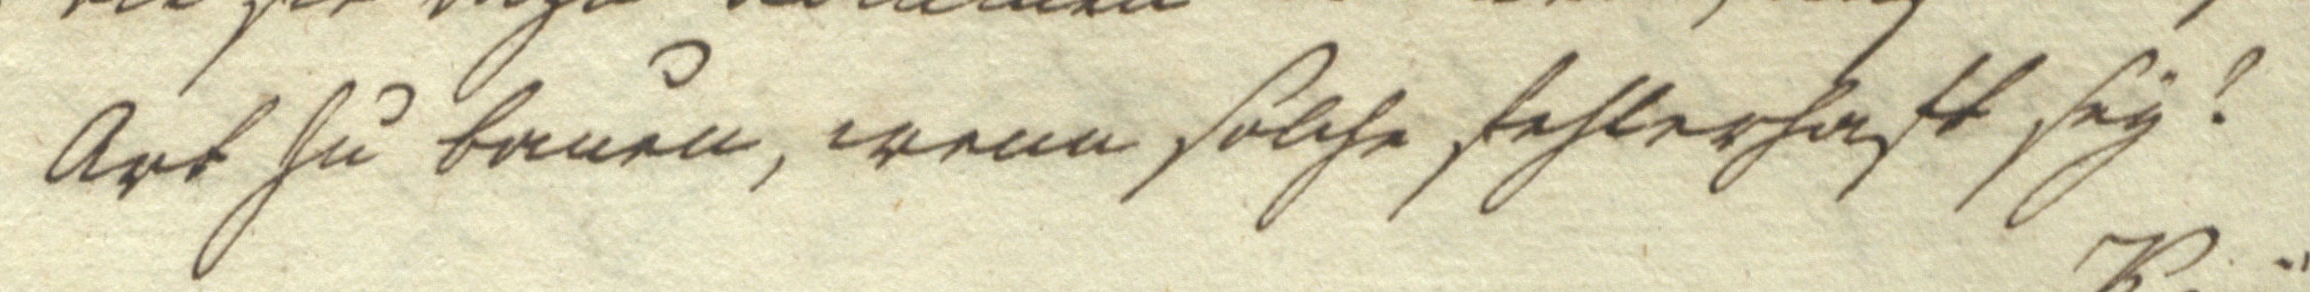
Art zu bauen, wenn solche fehlertaft seÿ?
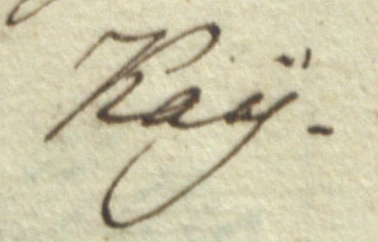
Kaÿ.
